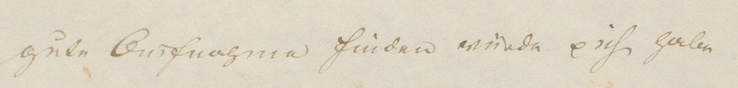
gute Aufnahme finden würde & ich habe
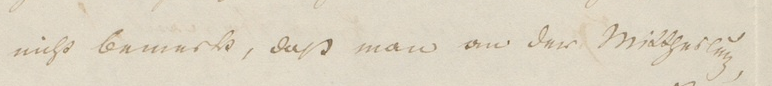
nicht bemerkt, daß man an der Mittheilung,
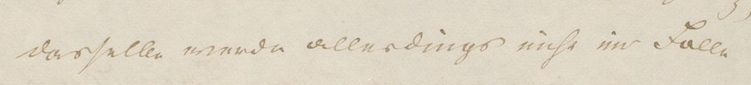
dasselbe werde allerdings nicht im Falle
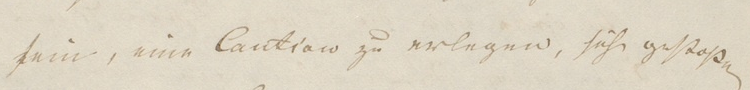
sein, eine Caution zu erlegen, sich gestoßen
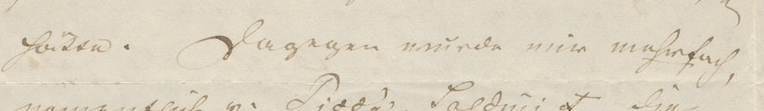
hätte. Dagegen wurde mir mehrfach,
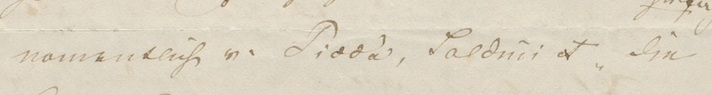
namentlich v. Pioda, Soldini etc die
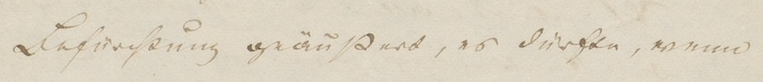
Befürchtung geäußert, es dürfte, wenn
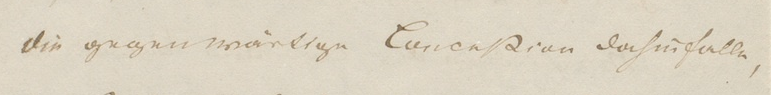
die gegenwärtige Conceßion dahinfalle,
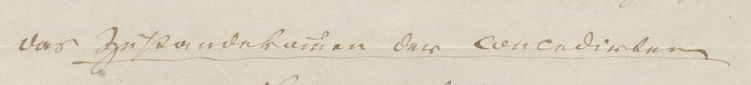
das Zustandekommen der concedirten
